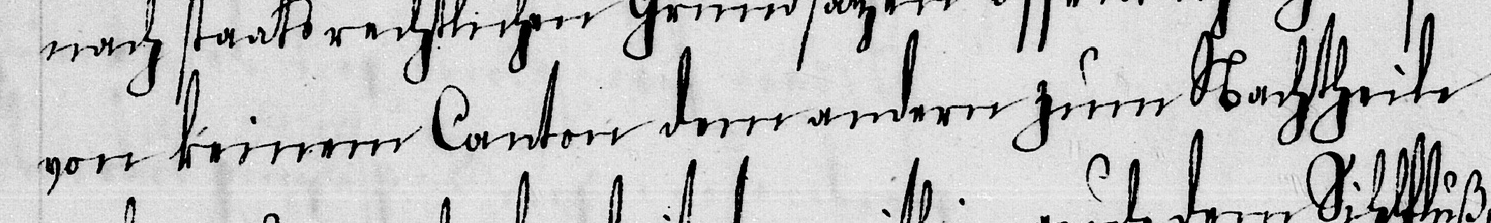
von keinem Canton dem andern zum Nachtheile
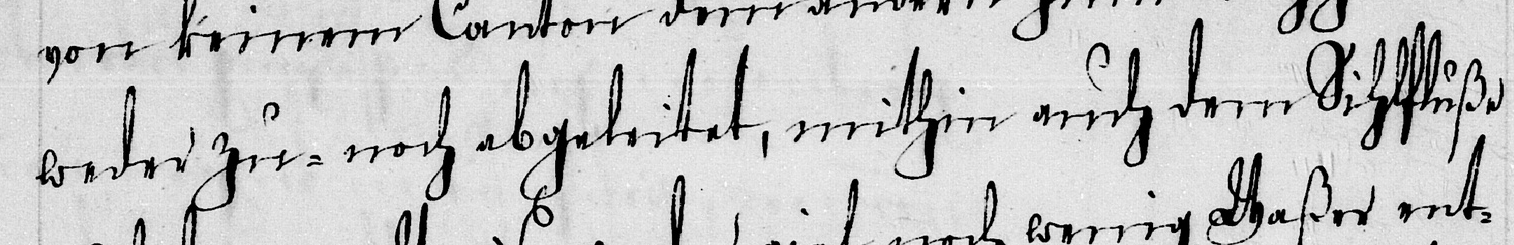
weder zu- noch abgeleitet, mithin auch dem Sihlfluße
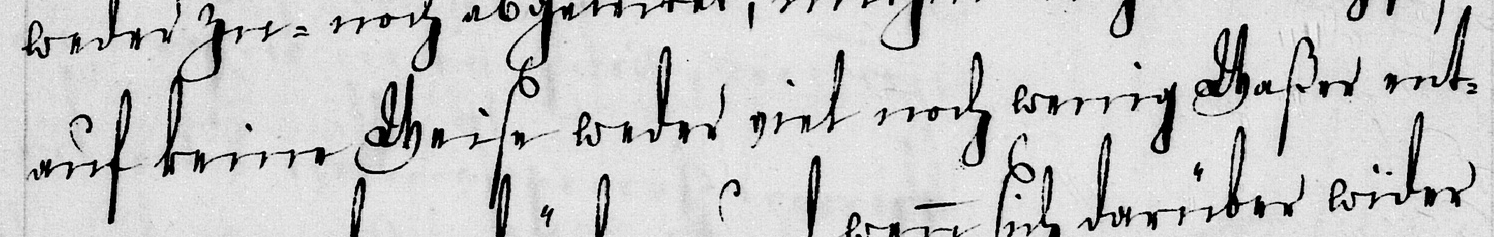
auf keine Weise weder viel noch wenig Waßer ent¬
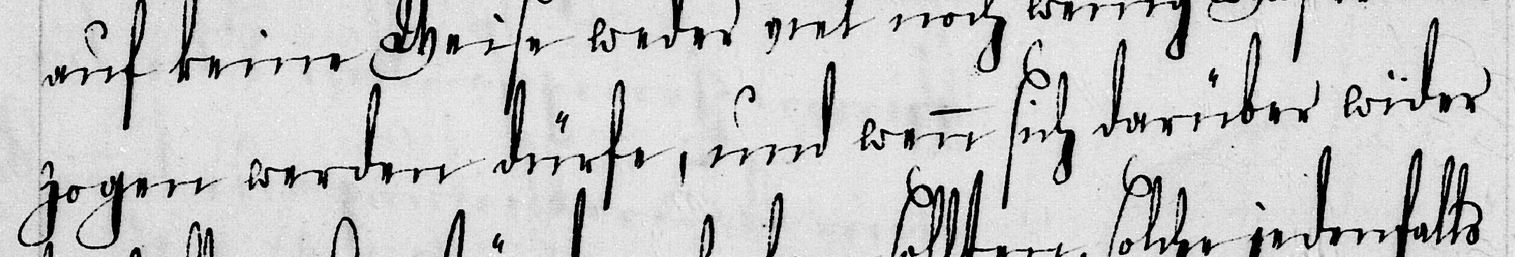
zogen werden dürfe, und wenn sich darüber wider
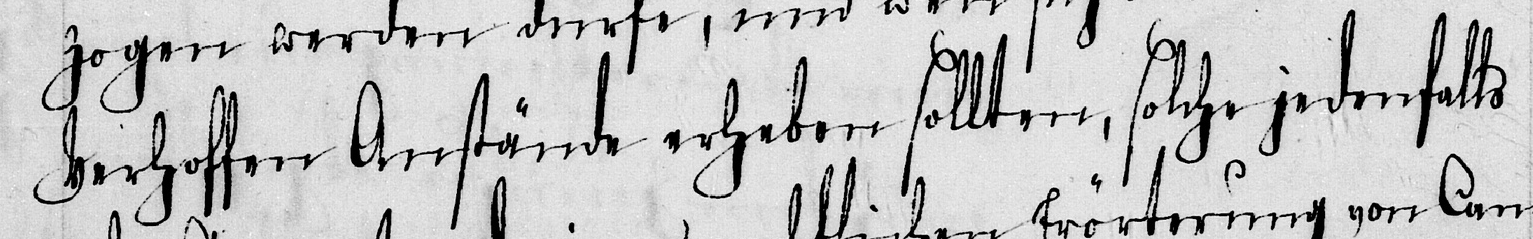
Verhoffen Anstände erheben sollten, solche jedenfal¬
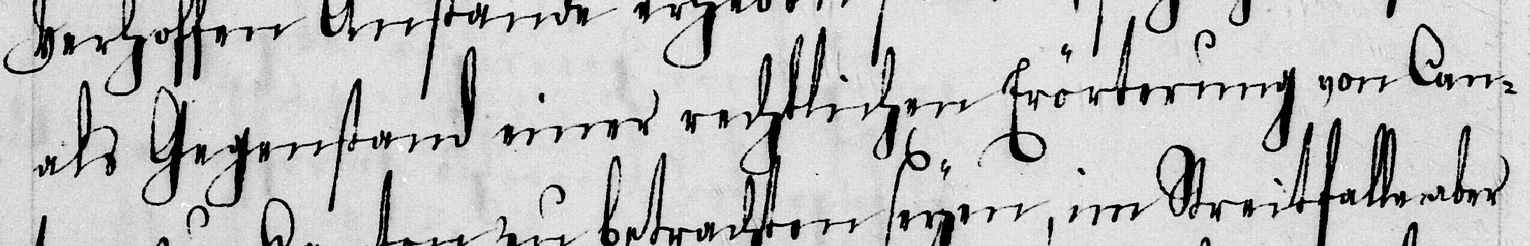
als Gegenstand einer rechtlichen Erörterung von Can¬
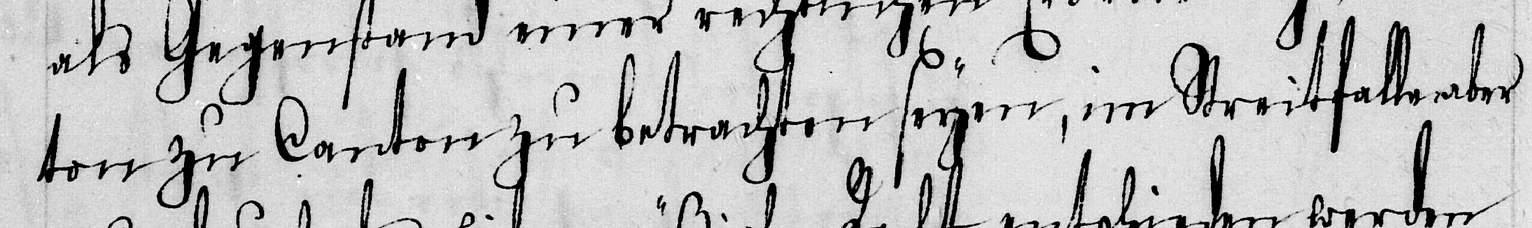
ton zu Canton zu betrachten seyen, im Streitfalle aber
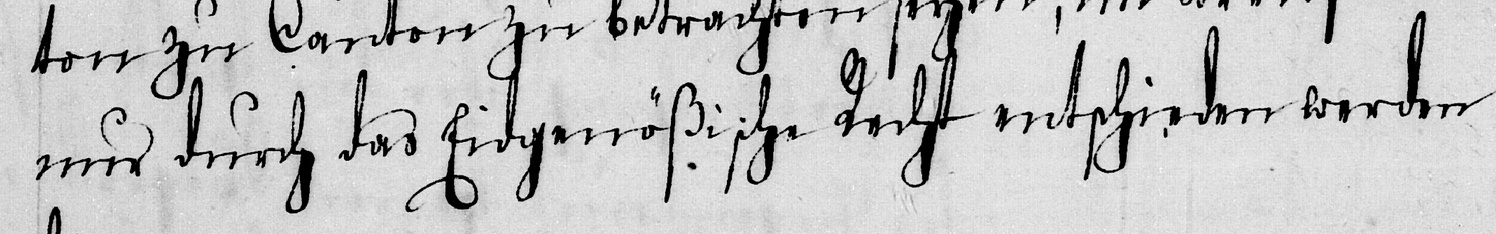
nur durch das Eidgenößische Recht entschieden werden
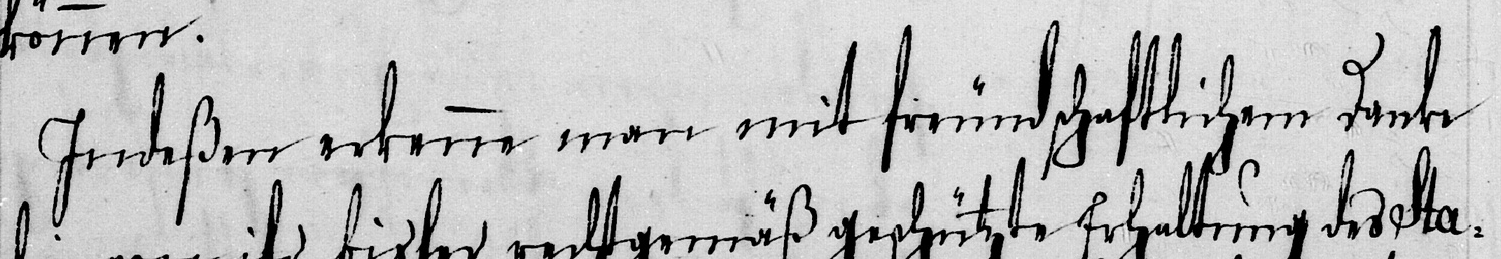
Indeßen erkenne man mit freundschaftlichem Danke
